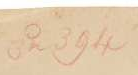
von Sybel,
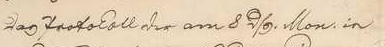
Das Protokoll der am 8 dss. Mon. in
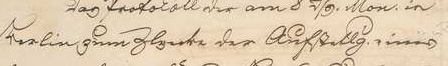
Berlin zum Zwecke der Aufstellg. eines
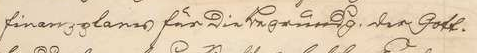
Finanzplanes für die Begründg. der Gott-
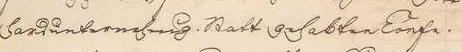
hardunternehmung Statt gehabten Confe-
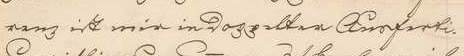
renz ist mir in doppelter Ausferti-
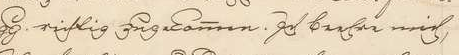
gg. richtig zugekommen. Ich beehre mich,
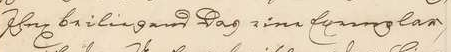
Ihnen beiliegend das eine Exemplar,
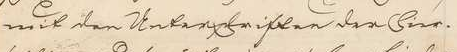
mit den Unterschriften der hier-
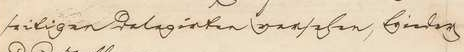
seitigen Delegirten versehen, wieder
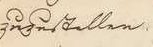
zuzustellen.
